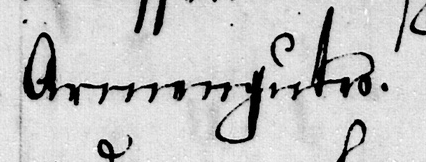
Armengutes.
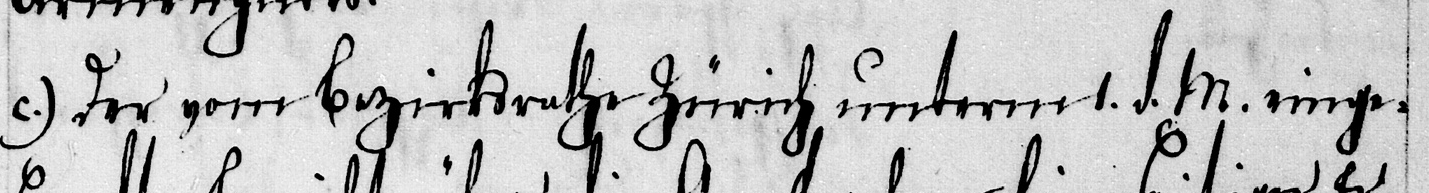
c.) Der vom Bezirksrathe Zürich unterm 1. d. M. einge¬
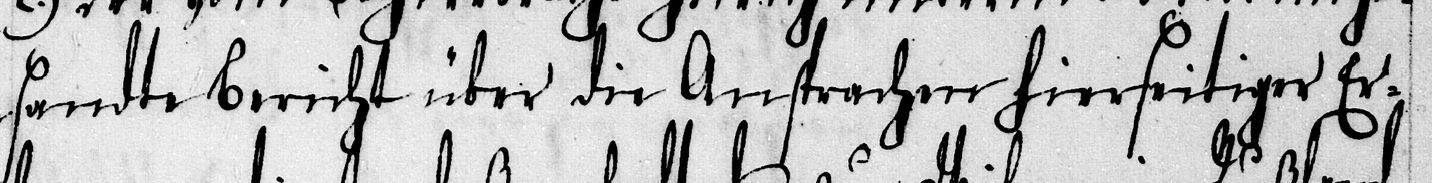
sandte Bericht über die Ansprachen hierseitiger Er¬
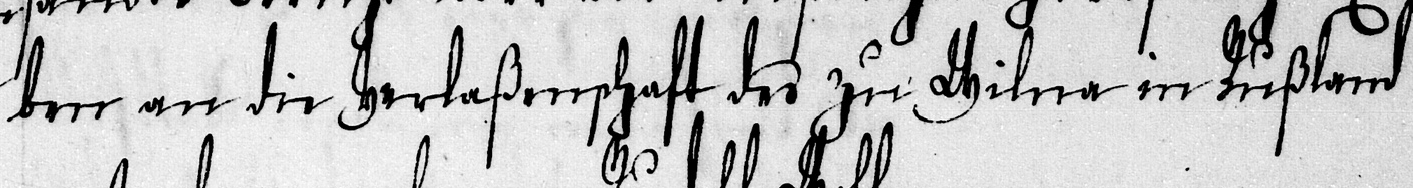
ben an die Verlaßenschaft des zu Wilna in Rußland
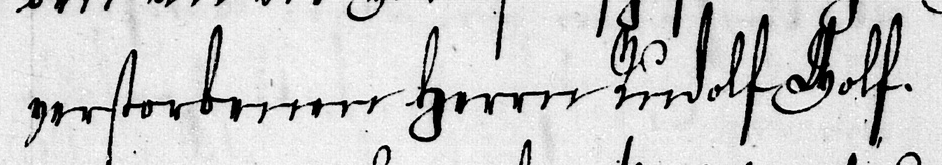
verstorbenen Herrn Rudolf Wolf.
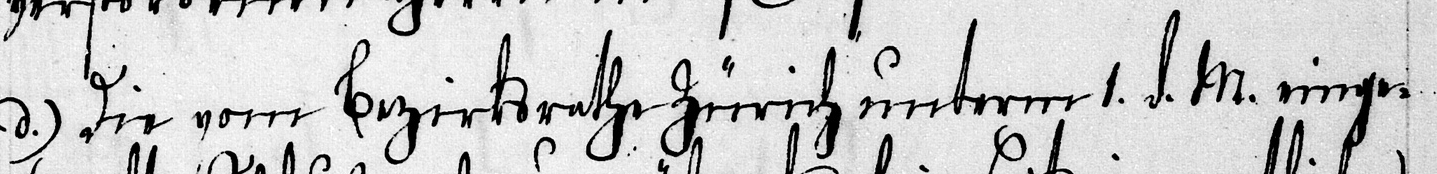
d.) Die vom Bezirksrathe Zürich unerm 1. d. M. einge¬
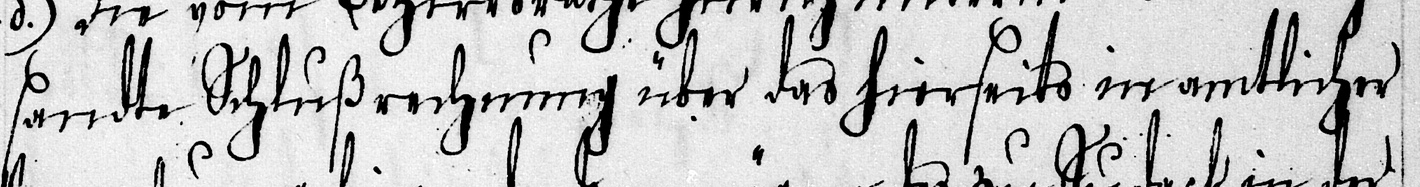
sandte Schlußrechnung über das hierseits in amtlicher
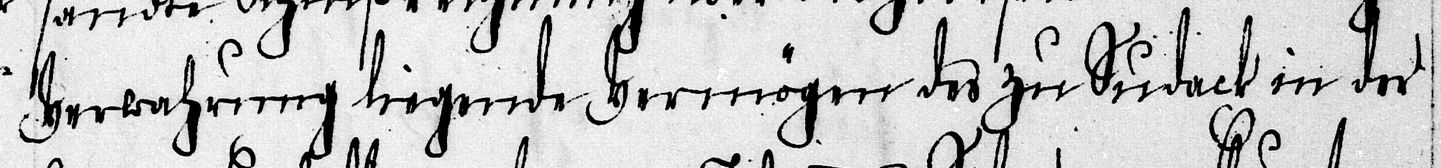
Verwahrung liegende Vermögen des zu Sudack in der
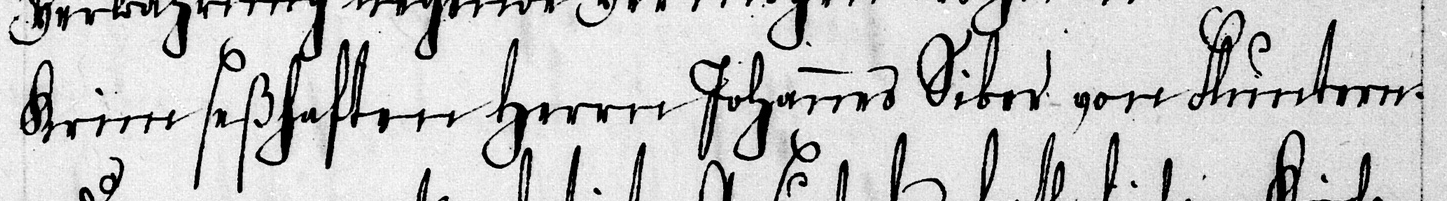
Krim seßhaften Herrn Johannes Siber von Fluntern.
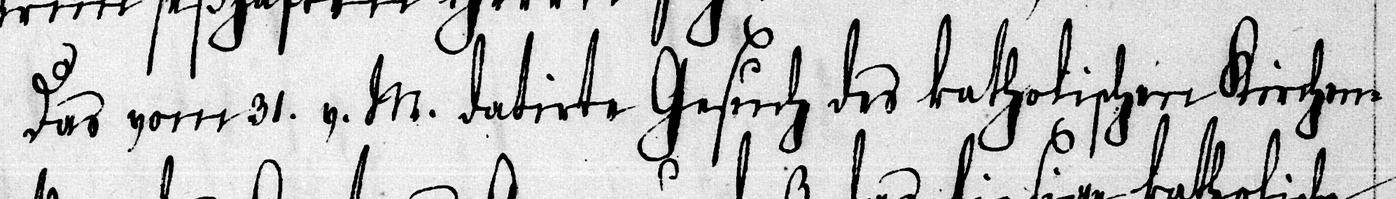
Das vom 31. v. M. datirte Gesuch des katholischen Kirchen¬
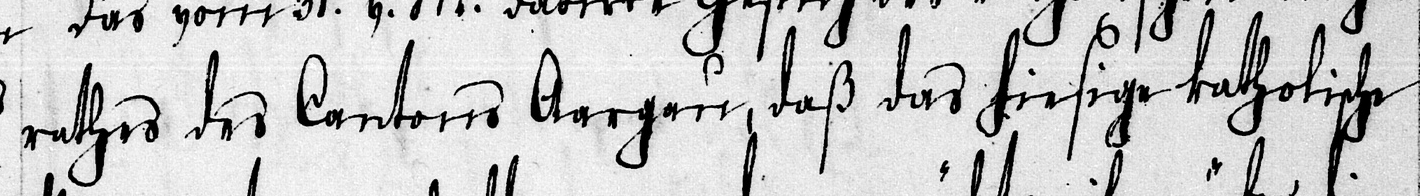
rathes des Cantons Aargau, daß das hiesige katholische
